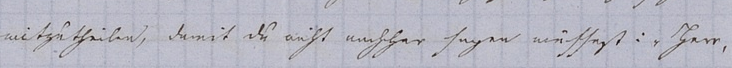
mitzutheilen, damit Du nicht nachher sagen müssest: «Herr,
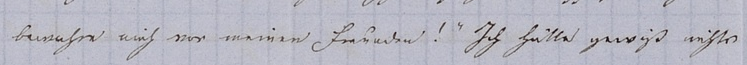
bewahre mich vor meinen Freunden!» Ich hätte gewiß nichts
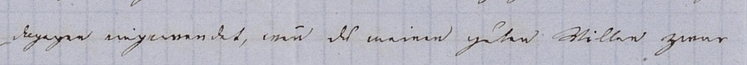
dagegen eingewendet, wenn Du meinen guten Willen zwar
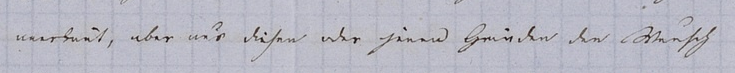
anerkannt, aber aus diesen oder jenen Gründen den Wunsch
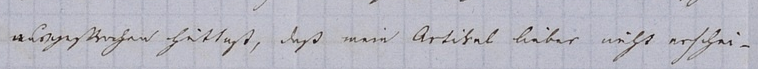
ausgesprochen hättest, daß mein Artikel lieber nicht erschei-
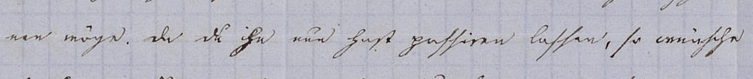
nen möge. Da Du ihn nun hast passiren lassen, so wünsche
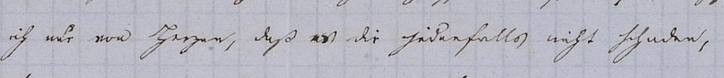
ich nur von Herzen, daß er Dir jedenfalls nicht schaden,
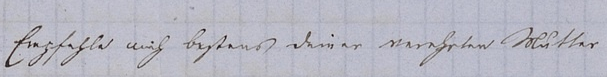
Empfehle mich bestens Deiner verehrten Mutter
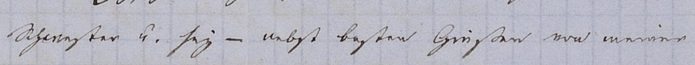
Schwester u. sey – nebst besten Grüßen von meiner
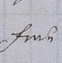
Frau –
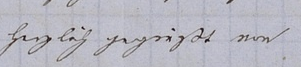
herzlich gegrüßt von
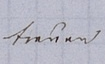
treuen
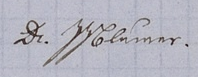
Dr. J J Blumer.
